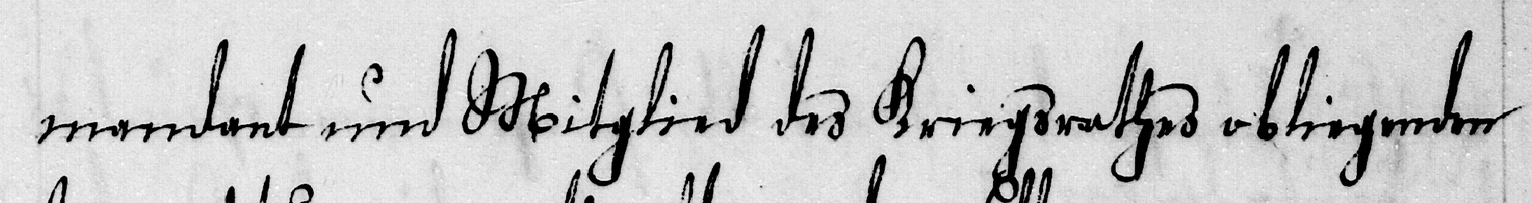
mandant und Mitglied des Kriegsrathes obliegenden
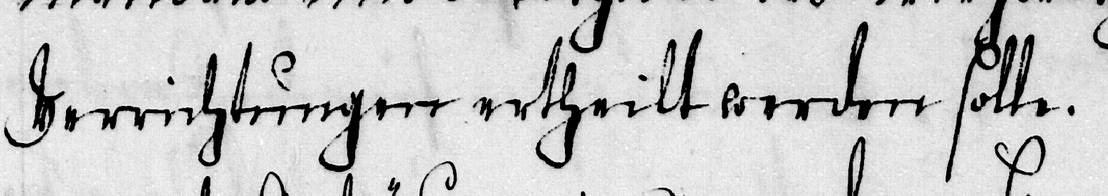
Verrichtungen ertheilt werden solle.
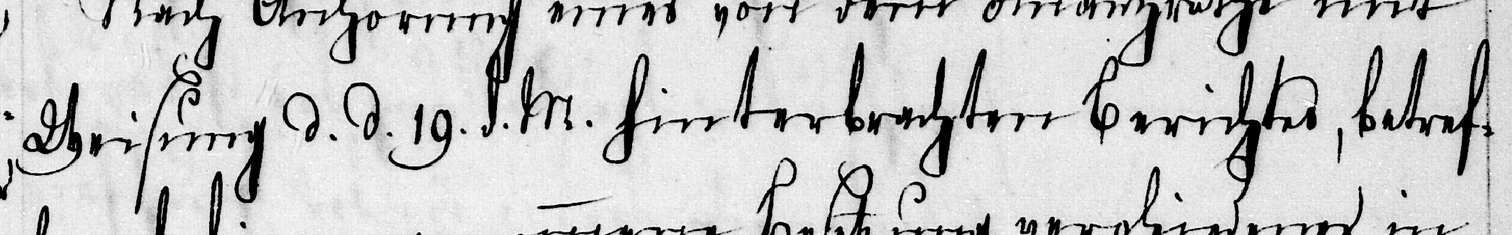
Weisung d. d. 19. d. M. hinterbrachten Berichtes, betref¬
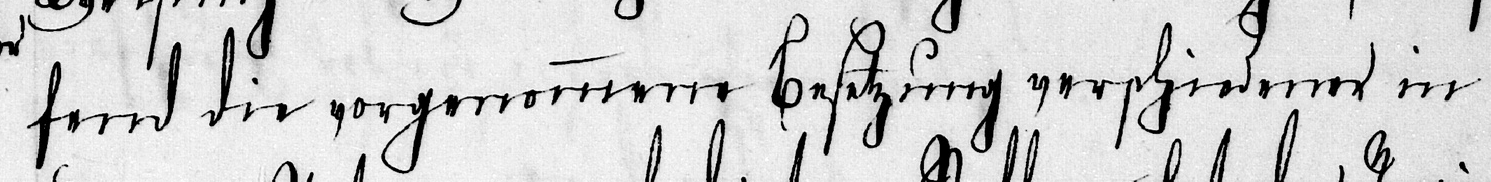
fend die vorgenommene Besetzung verschiedener in
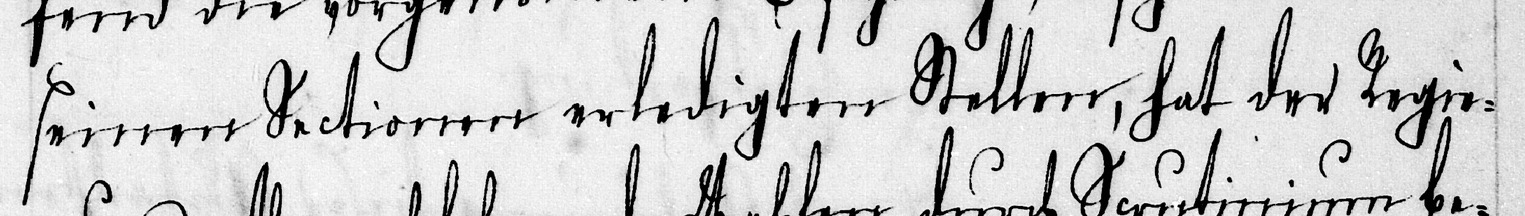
seinen Sectionen erledigten Stellen, hat der Regie¬
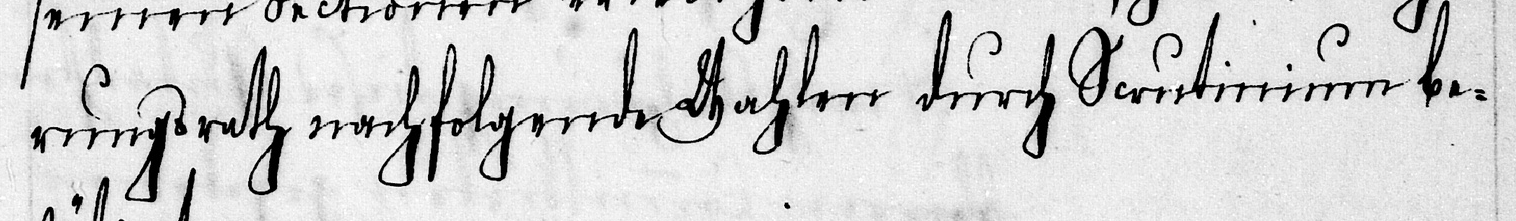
rungsrath nachfolgende Wahlen durch Scrutinium be¬
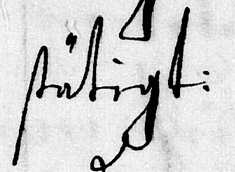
stätigt:
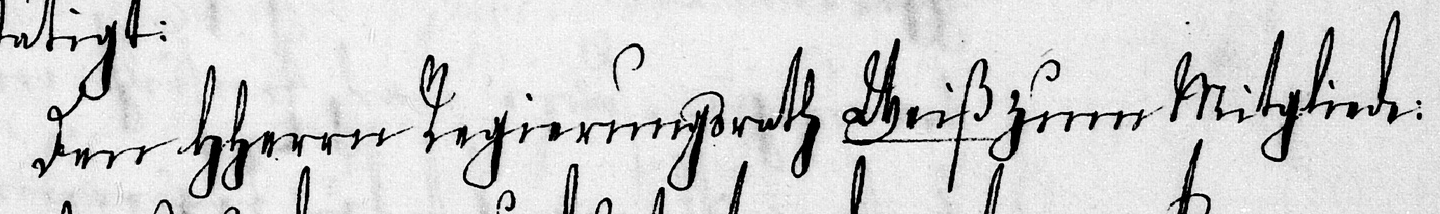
Den HHerrn Regierungsrath Weiß zum Mitgliede:
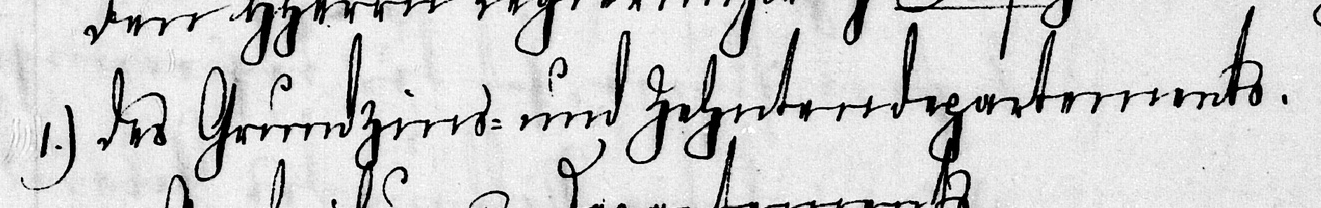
1.) des Grundzins-und Zehntendepartements.
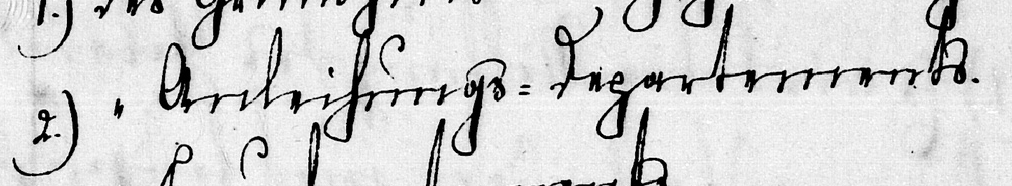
2.) " Anleihungs-Departements.
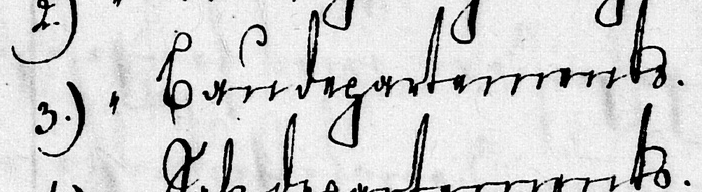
3.) " Baudepartements.
